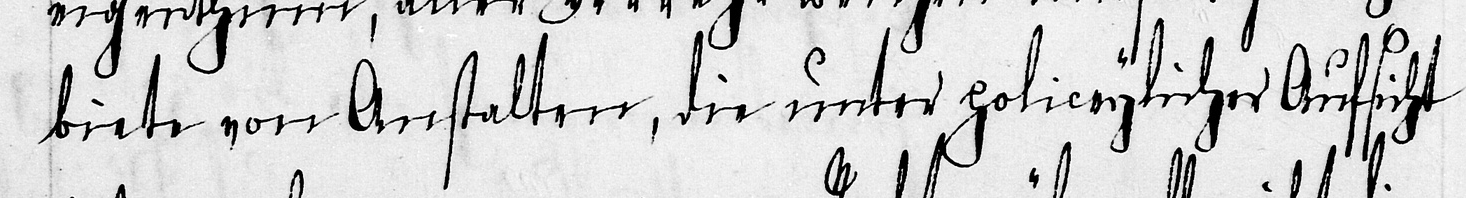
biete von Anstalten, die unter policeylicher Aufsicht
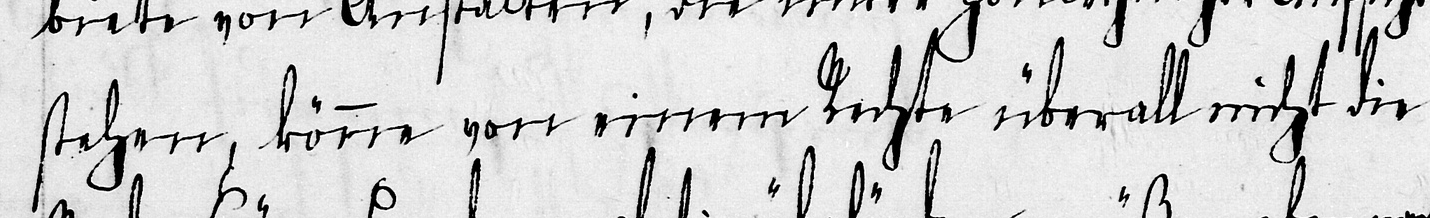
stehen, könne von einem Rechte überall nicht die
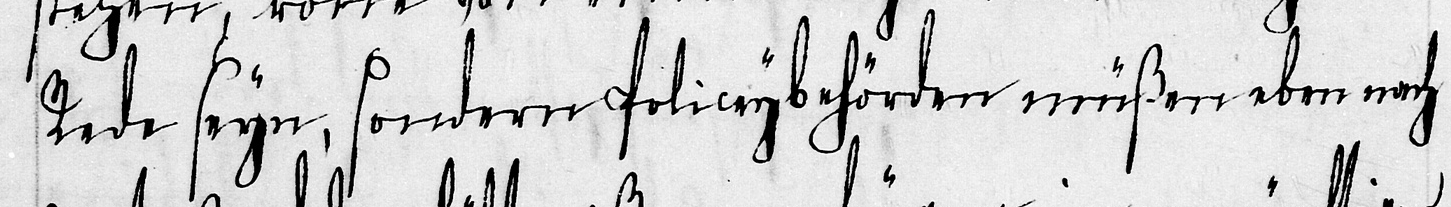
Rede seyn, sondern Policeybehörden müßen eben nach
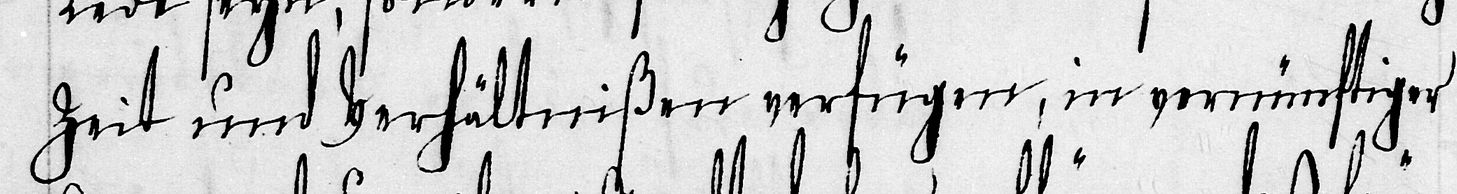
Zeit und Verhältnißen verfügen, in vernünftiger
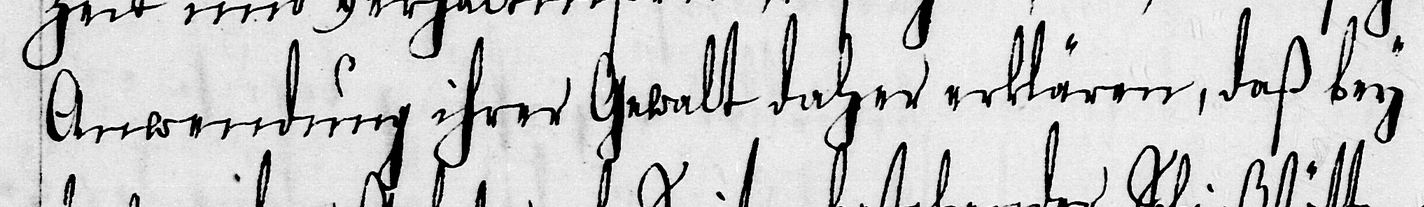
Anwendung ihrer Gewalt daher erklären, daß bey
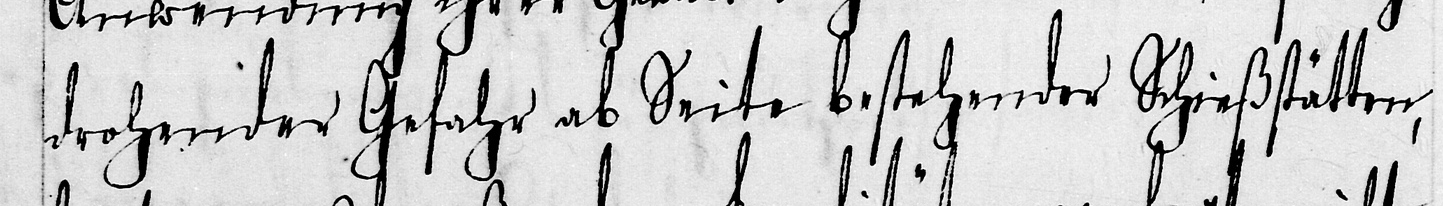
drohender Gefahr ab Seite bestehender Schießstätte¬
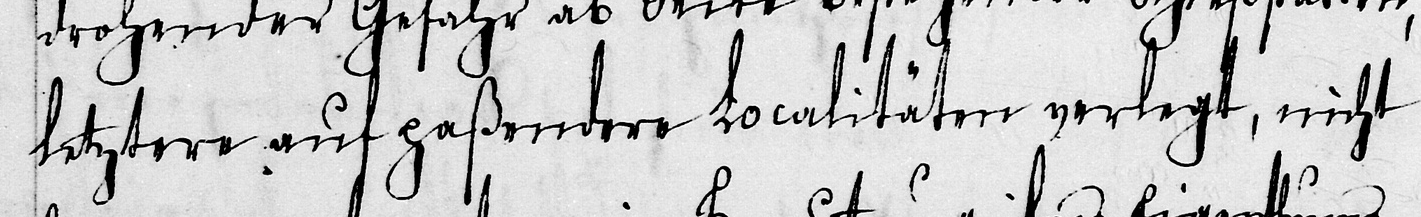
letztere auf paßendere Localitäten verlegt, nicht
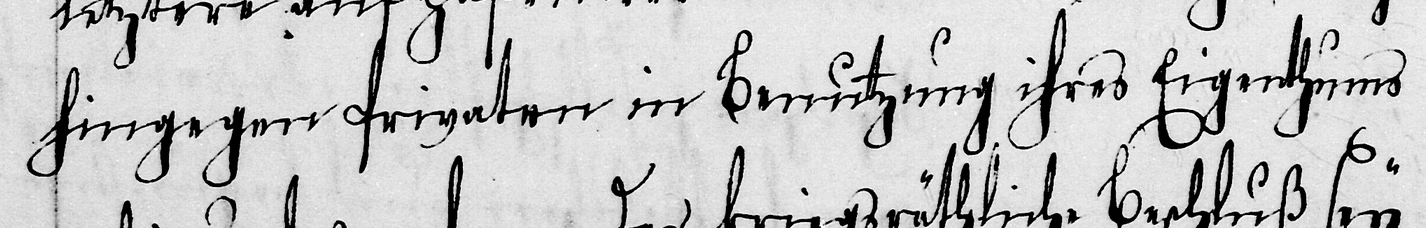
hingegen Privaten in Benutzung ihres Eigenthums
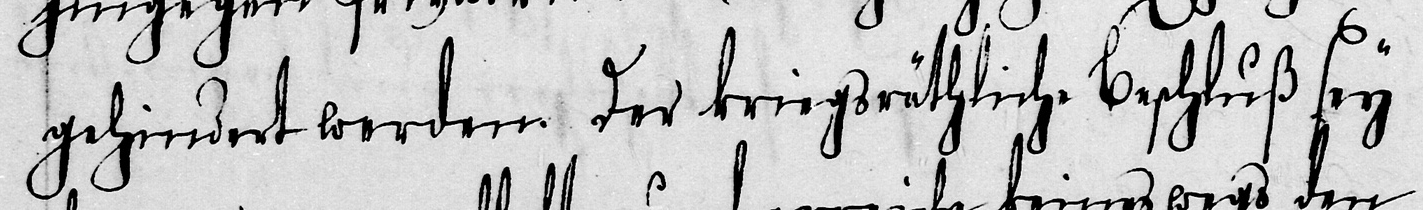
gehindert werden. Der kriegsräthliche Beschluß sey
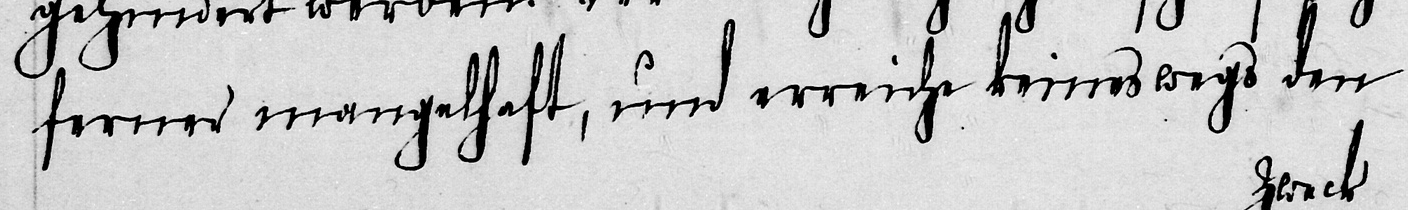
ferner mangelhaft, und erreiche keineswegs den
